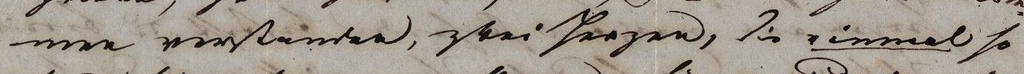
men verstanden, zwei Herzen, die einmal so
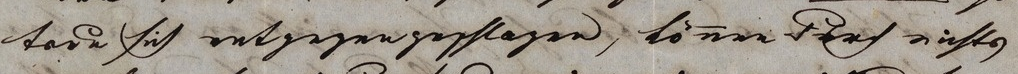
treu sich entgegengeschlagen, können durch nichts
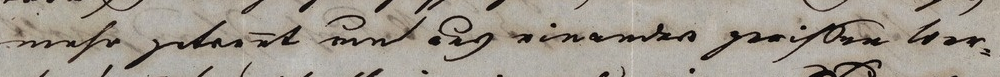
mehr getrennt und auseinander gerissen wer-
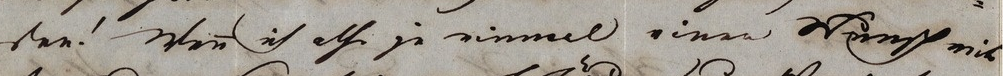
den! Wenn ich also je einmal einen Wunsch mit
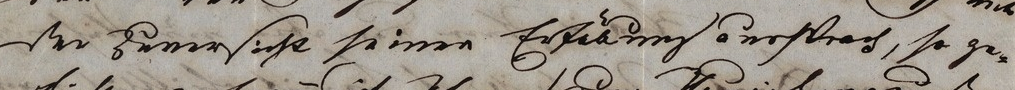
der Zuversicht seiner Erfüllung aussprach, so ge-
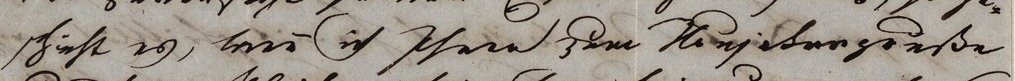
schieht es, wenn ich Ihnen zum Neujahrsgruße
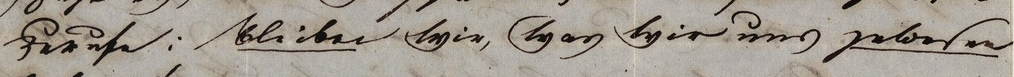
zurufe: Bleiben wir, was wir uns gewesen
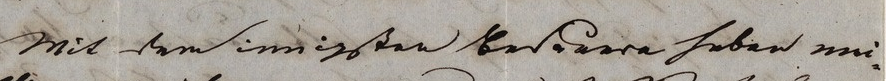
Mit dem innigsten Bedauern haben mei-
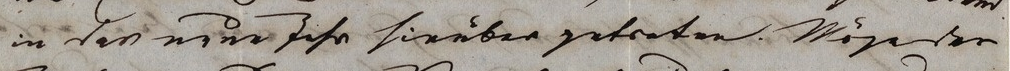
in das neue Jahr hinüber getreten. Möge der
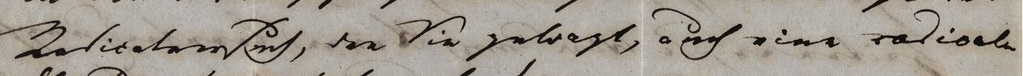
Radicalversuch, den Sie gewagt, auch eine radicale
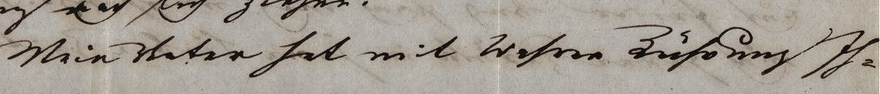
Mein Vater hat mit wahrer Rührung Ih-
